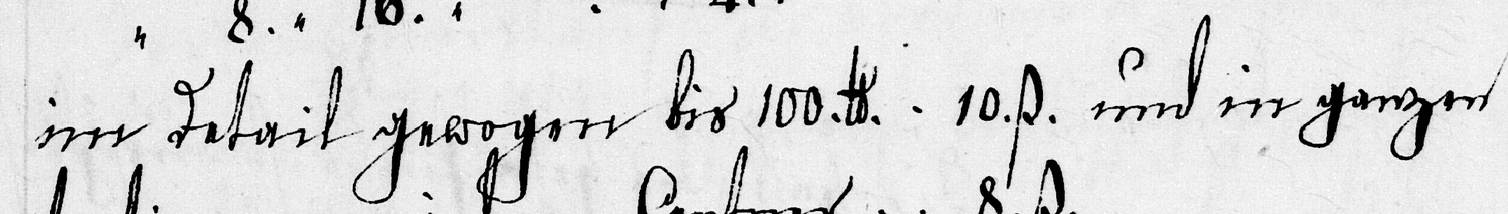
im Detail gewogen bis 100. Pfd. 10. ß und in ganzen
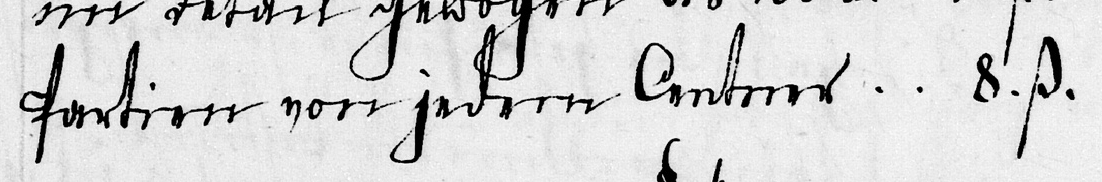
Portionen von jedem Centner 8. ß.
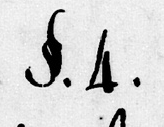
§. 4.
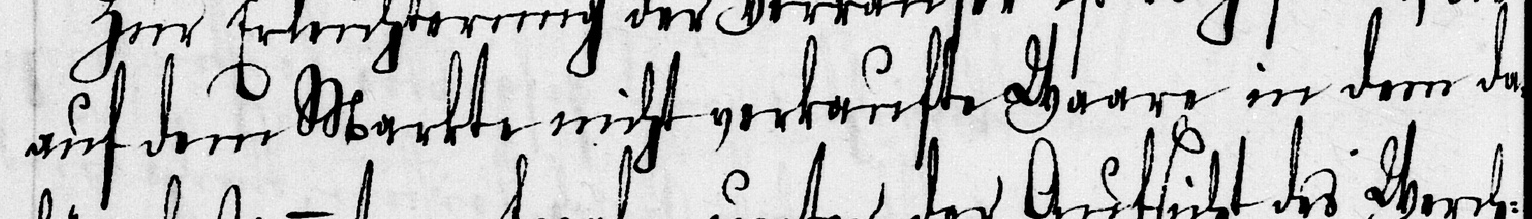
auf dem Markte nicht verkaufte Waare in dem d¬
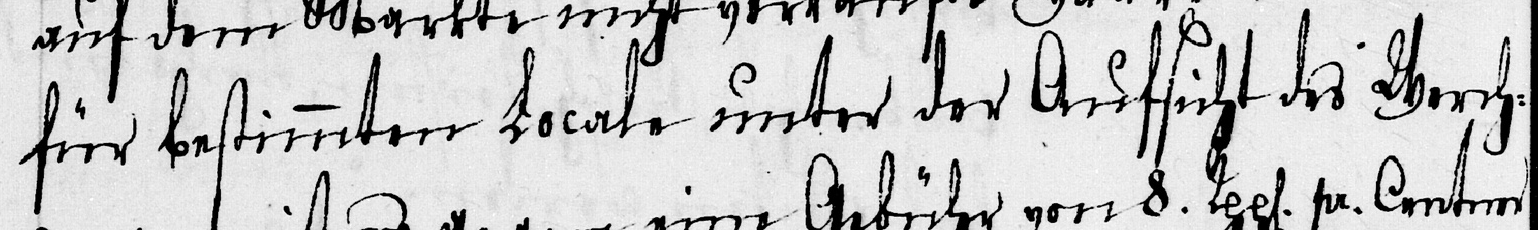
afür bestimmten Locale unter der Aufsicht des Werch¬
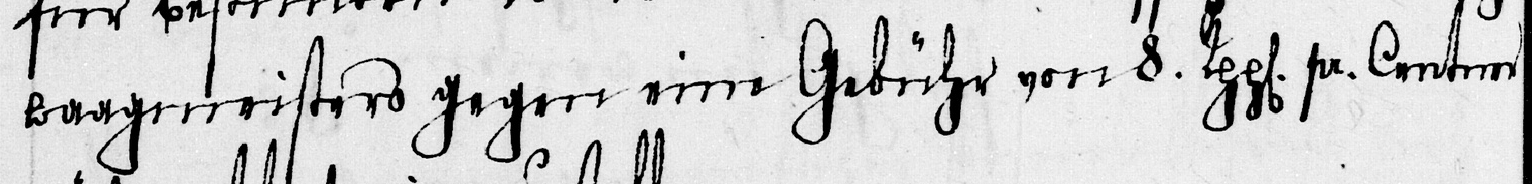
waagmeisters gegen eine Gebühr von 8. Rpp[en]. pr. Centner
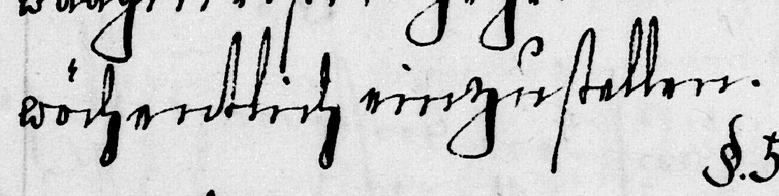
wöchentlich einzustellen.
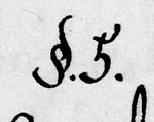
§. 5.
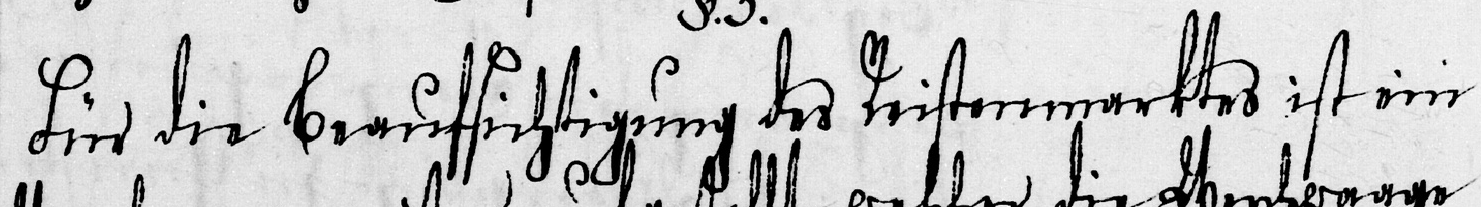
Für die Beaufsichtigung des Reistenmarktes ist ein
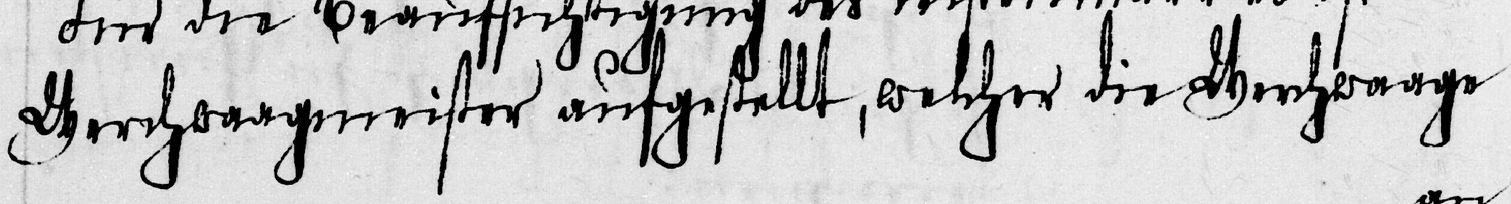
Werchwaagmeister aufgestellt, welcher die Werchwaage
